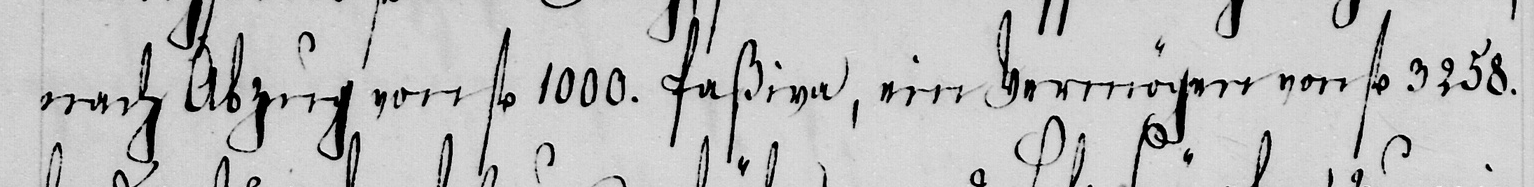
nach Abzug von fl. 1000. Paßiva, ein Vermögen von fl. 3258.
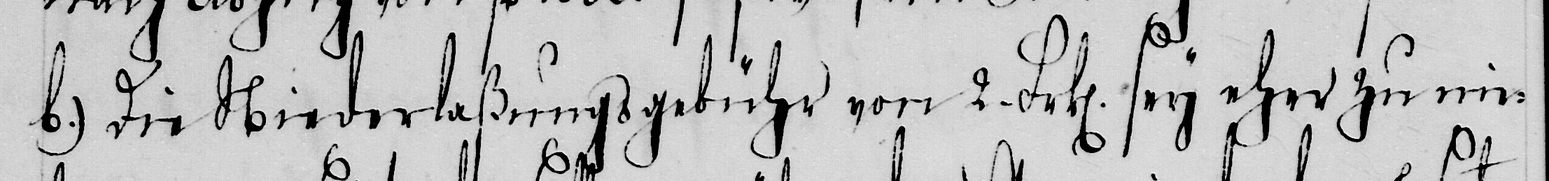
b.) Die Niederlaßungsgebühr von 2. Frk[en]. sey eher zu nie¬
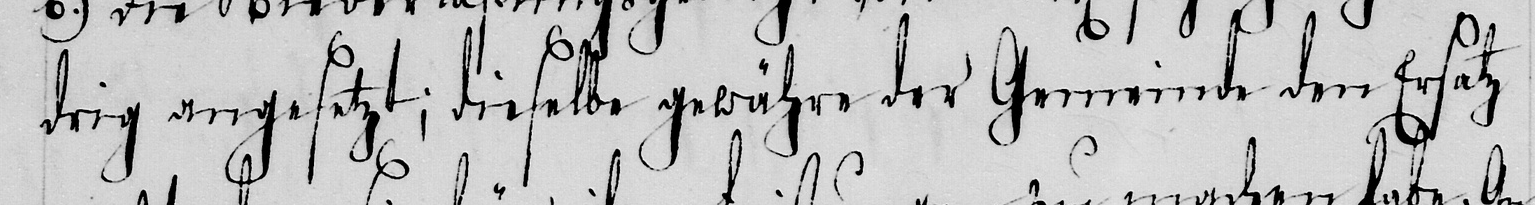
drig angesetzt; dieselbe gewähre der Gemeinde den Ersatz
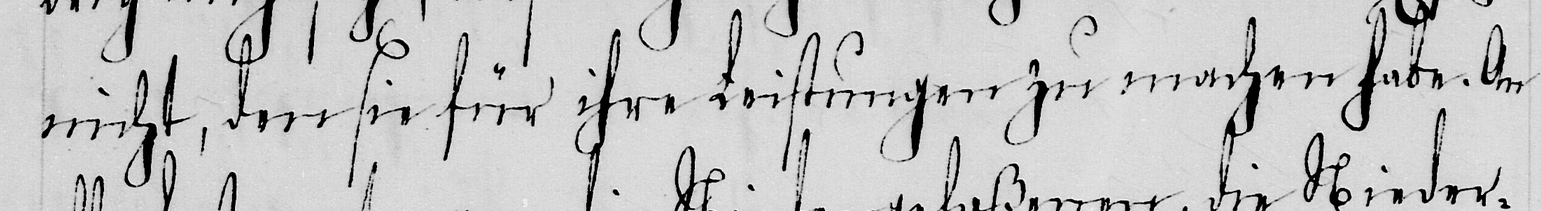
nicht, den sie für ihre Leistungen zu machen habe. An
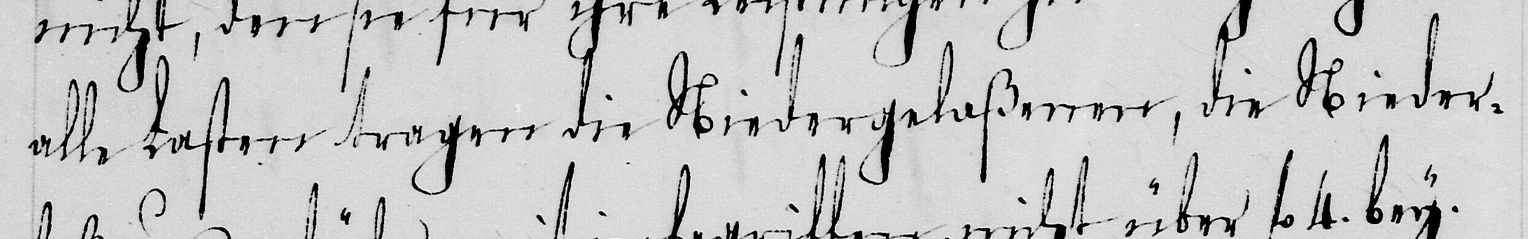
alle Lasten tragen die Niedergelaßenen, die Nieder¬
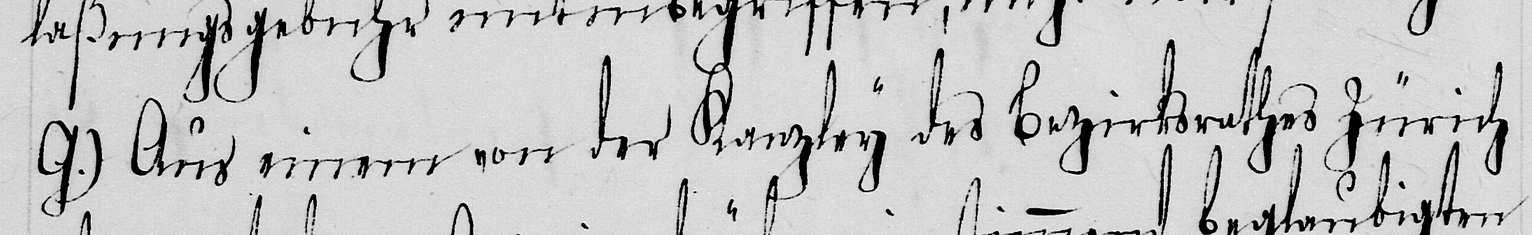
G.) Aus einem von der Kanzley des Bezirksrathes Zürich
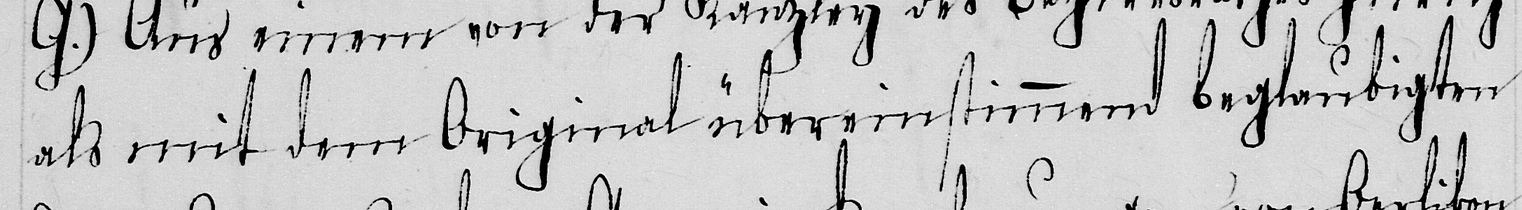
als mit dem Original übereinstimmend beglaubigten
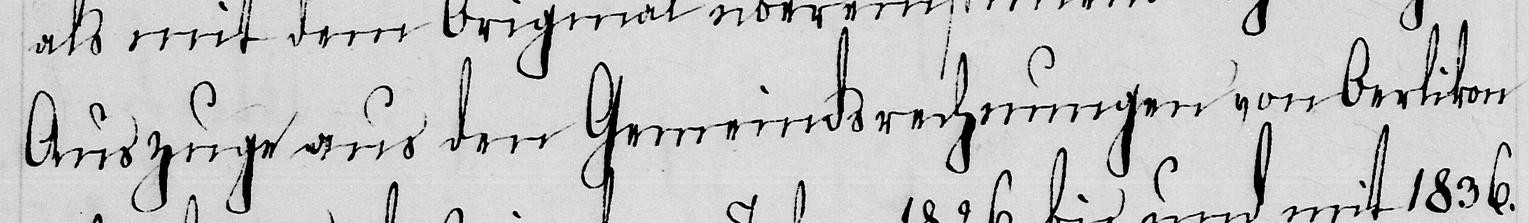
Auszuge aus den Gemeindsrechnungen von Oerlikon
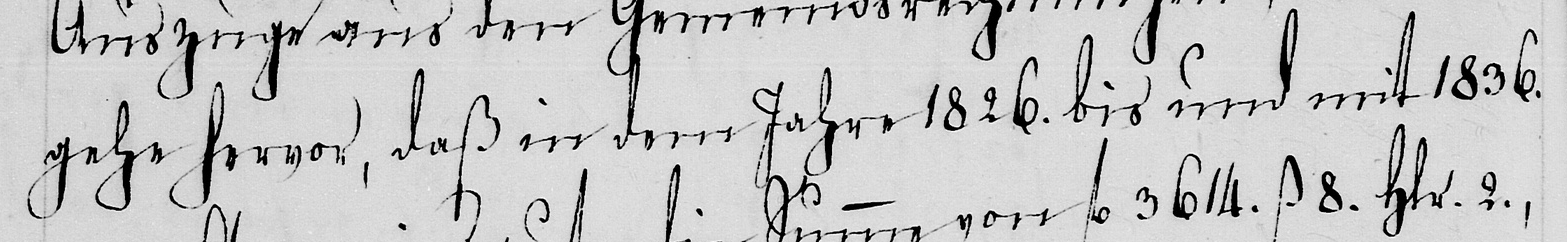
gehe hervor, daß in dem Jahre 1826. bis und mit 19836.
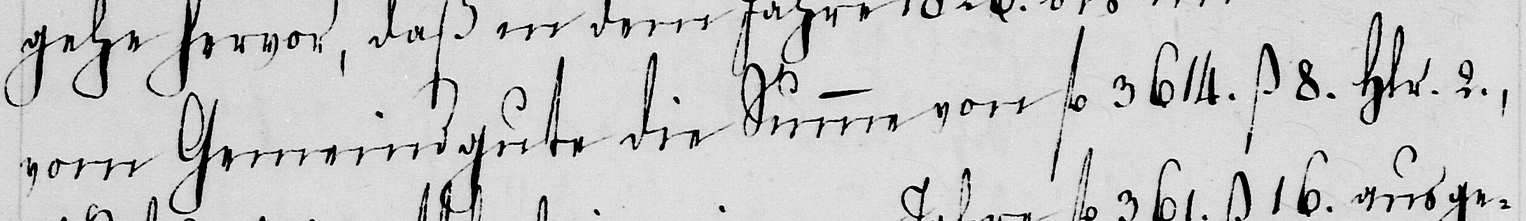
vom Gemeindgute die Summe von fl. 3614. ß. 8. Hlr. 2.,
